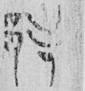邦
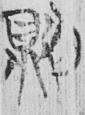則
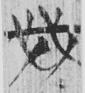戔（殘）
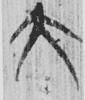大
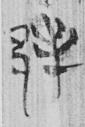邦
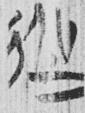○（過）
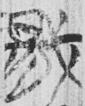○（傷）
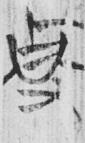○（變）
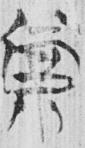常
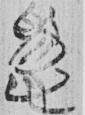惖（易）
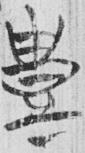豊（禮）
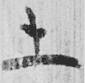土
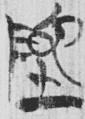地
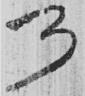乃
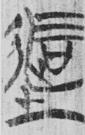○（坼）
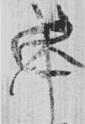民
